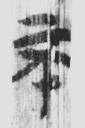不
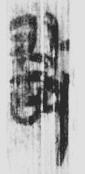敢
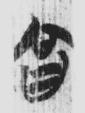○（答）
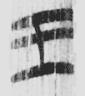王
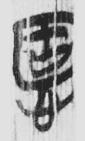○（固）
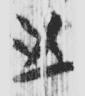之
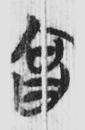合
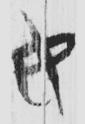女（如）
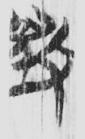毀
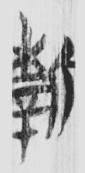新
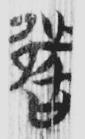都
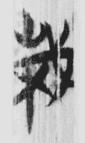栽
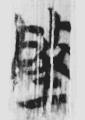陵
